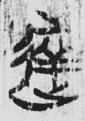○（失）
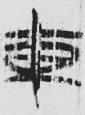車
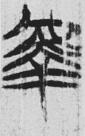○（甲）
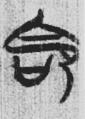命
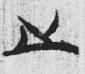之
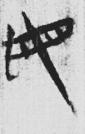母
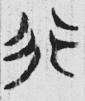行
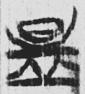明日
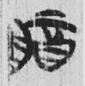○（将）
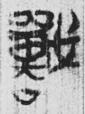○（戰）
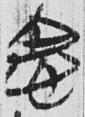思
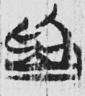爲
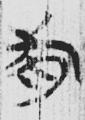前
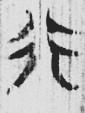行
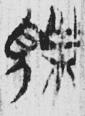○（諜○）
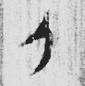人
